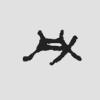凡
